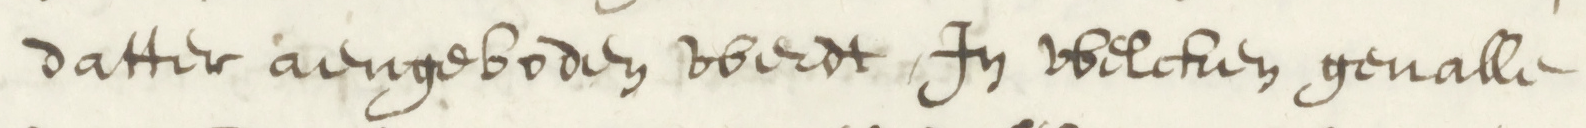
datter aengeboden werdt. In welcken gevalle
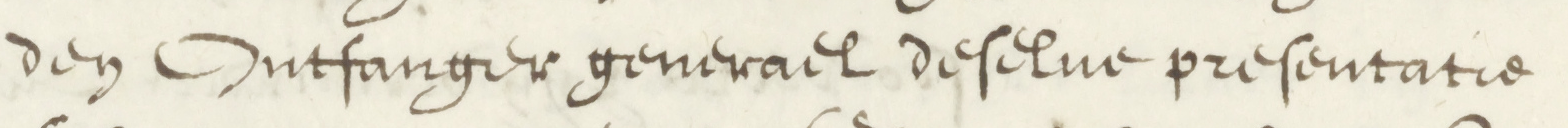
den Ontfanger generael deselve presentatie
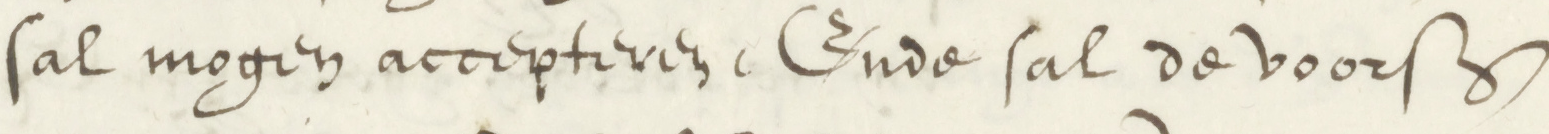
sal mogen accepteren. Ende sal de voors
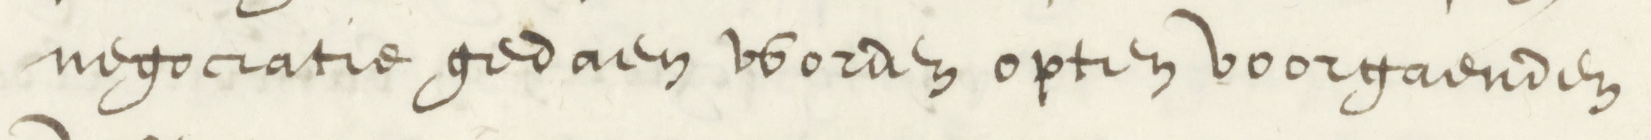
negociatie gedaen worden opten voorgaenden
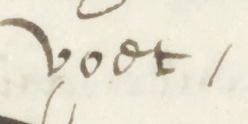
voet.
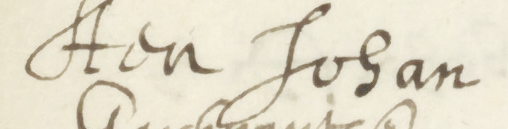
Aen Johan
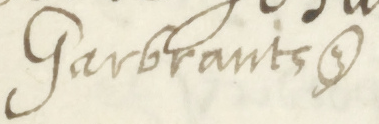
Garbrantsz
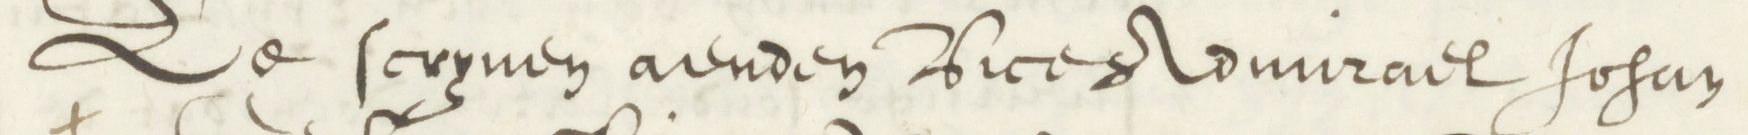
Te scryuen aenden Vice Admirael Johan
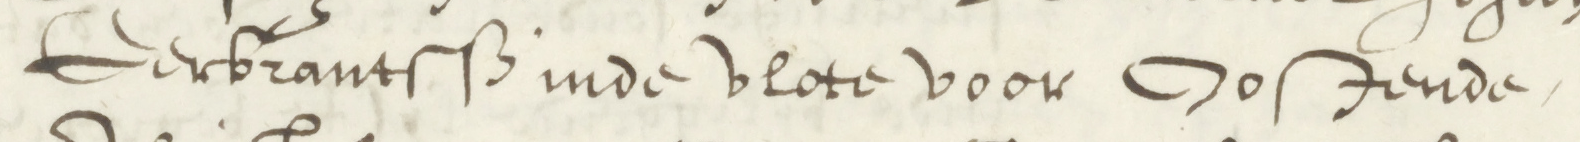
Gerbrantssz inde vlote voor Oostende
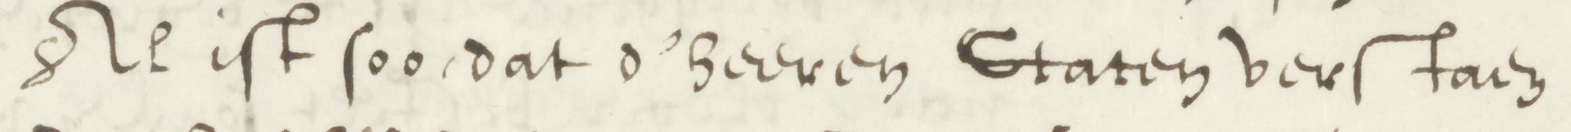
Al ist soo, dat d‛heeren Staten verstaen
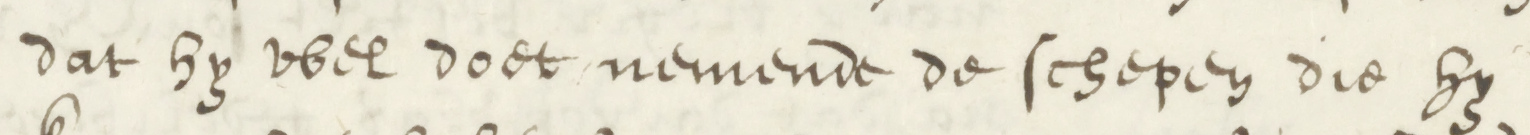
dat hy wel doet nemende de schepen die hy
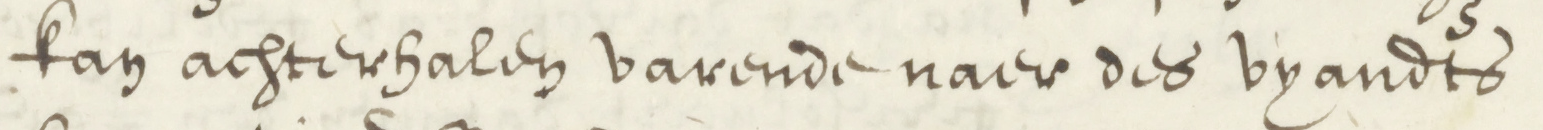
kan achterhalen varende naer des vyandts
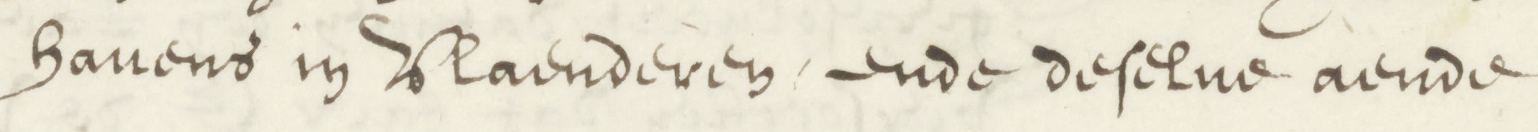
hauens in Vlaenderen, ende deselue aende
